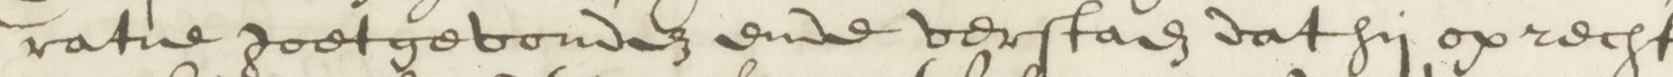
ratie goetgevonden ende verstaen dat hij oprecht
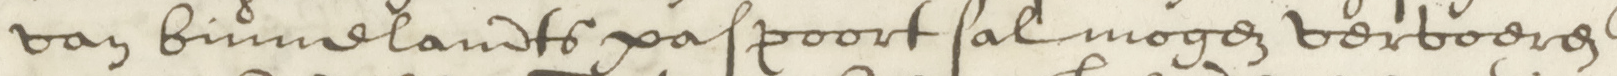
van binnelandts paspoort sal mogen vervoeren
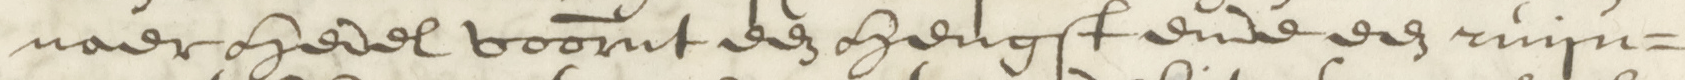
naer Hedel voornt een Hengst ende een ruijn„
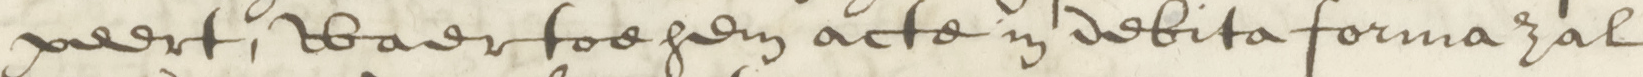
peert, waertoe hem acte in debita forma zal
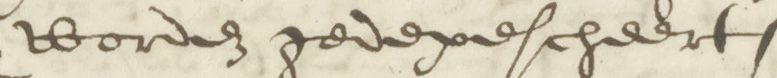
worden gedepescheert.
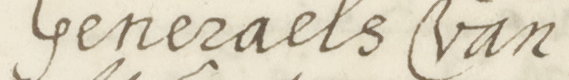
Generaels van
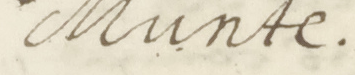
Munte.
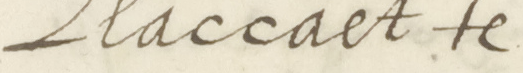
Placcaet te
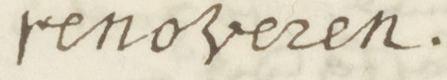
renoveren.
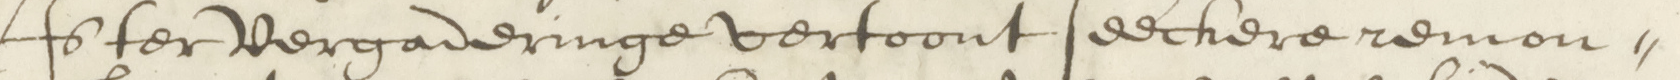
Is ter Vergaderinge vertoont seeckere remon„
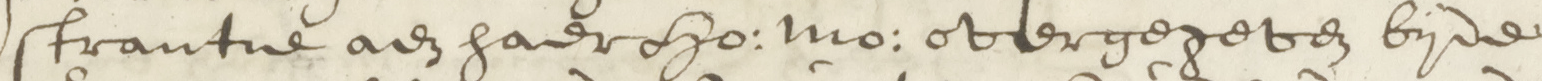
strantie aen haer Ho:Mo: overgegeven bijde
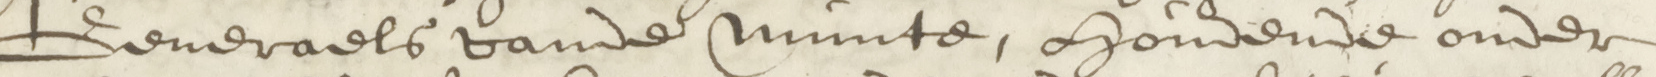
Generaels vande Munte, houdende onder
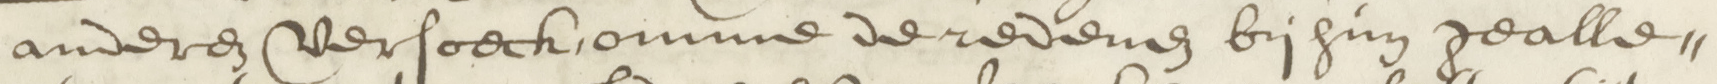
anderen Versoeck, omme de redenen bij hun gealle„
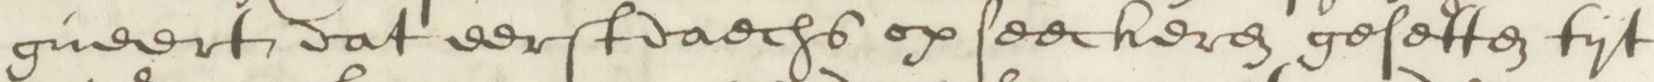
gueert, dat eerstdaechs op seeckeren gesetten tijt
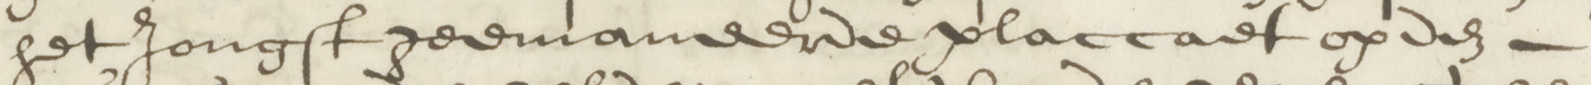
het Jongst geemaneerde placcaet op den —
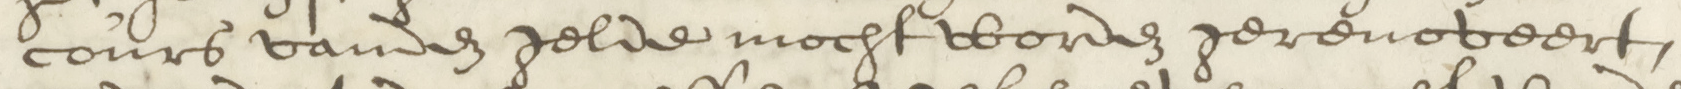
cours vanden gelde mocht worden gerenoveert,
